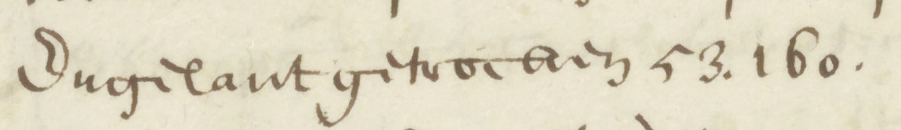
Engelant getrocken 53. 160.
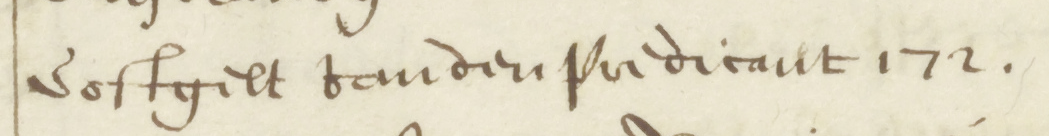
Costgelt vanden Predicant 172.
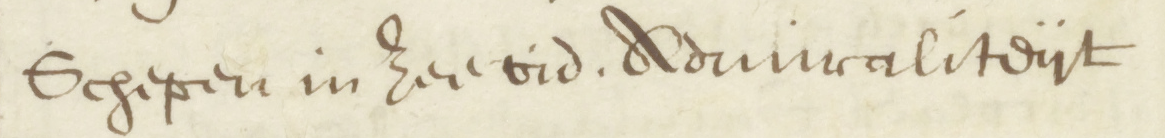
Schepen in Zee vid. Admiraliteijt
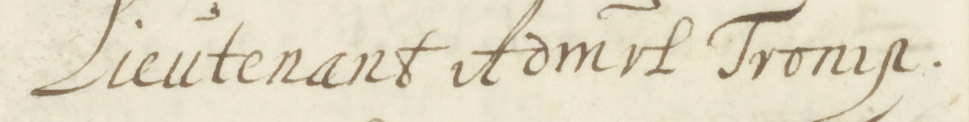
Lieutenant Admrl Tromp.
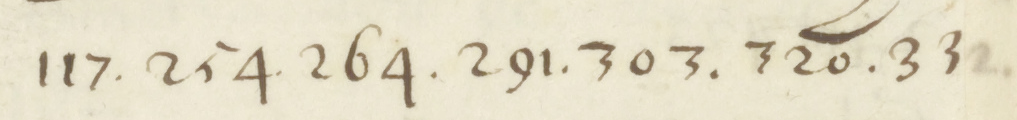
117. 254. 264. 291. 303. 320. 332.
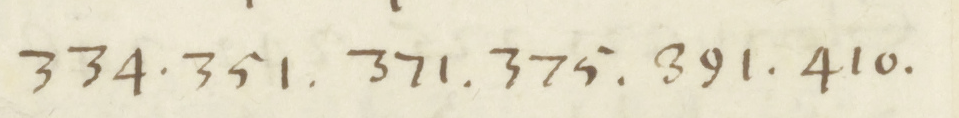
334. 351. 371. 375. 391. 410.
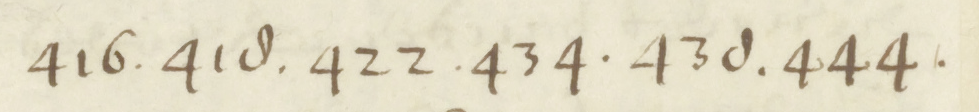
416. 418. 422. 434. 438. 444.
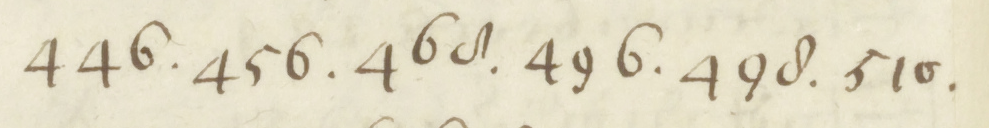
446. 456. 468. 496. 498. 510.
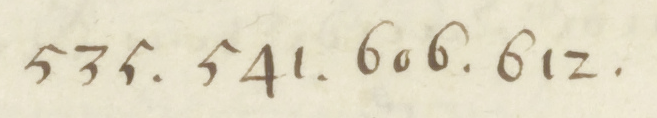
535. 541. 606. 612.
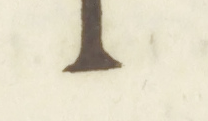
T
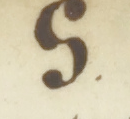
S.
